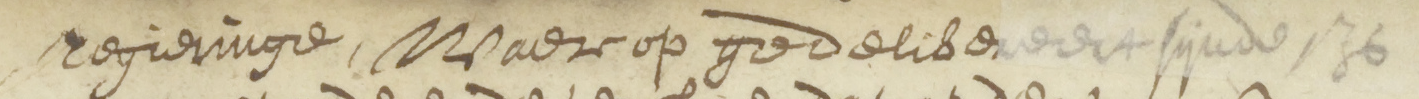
regieringe, Waerop gedelibereert sijnde, Is
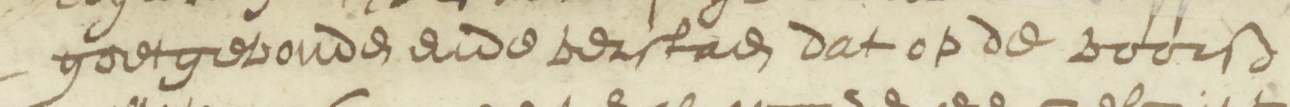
goetgevonden ende verstaen dat op de voorsz
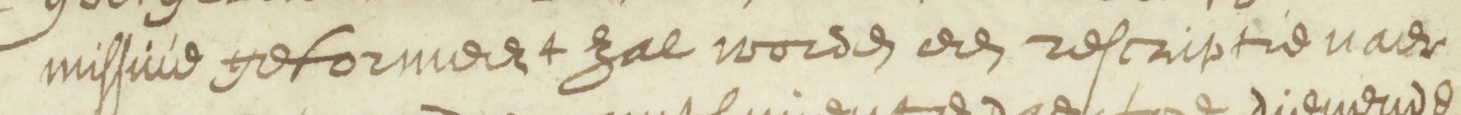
missive geformeert zal worden een rescriptie naer
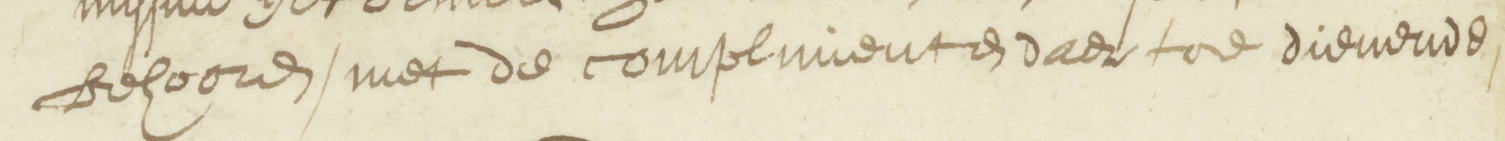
behooren, met de complimenten daaertoe dienende.
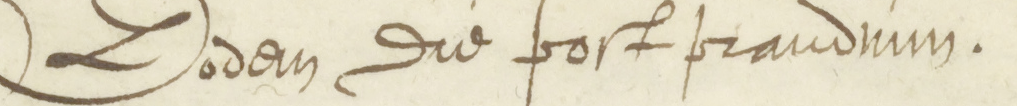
Eodem die post prandium.
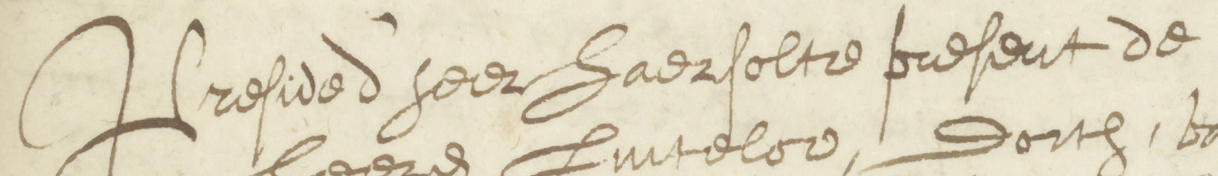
Preside d'heer Haersolte present de
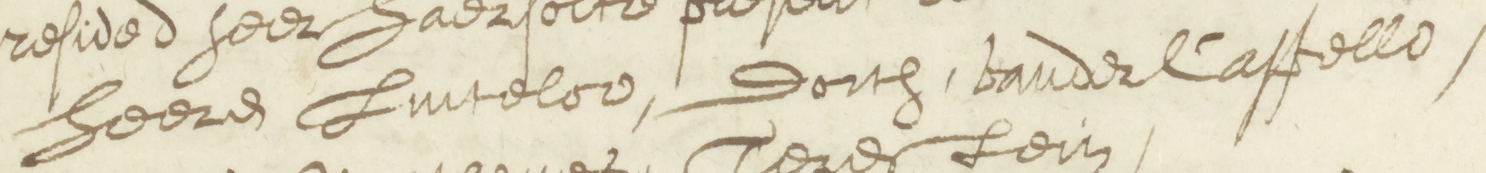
heeren Linteloo, Dorth, vander Cappello,
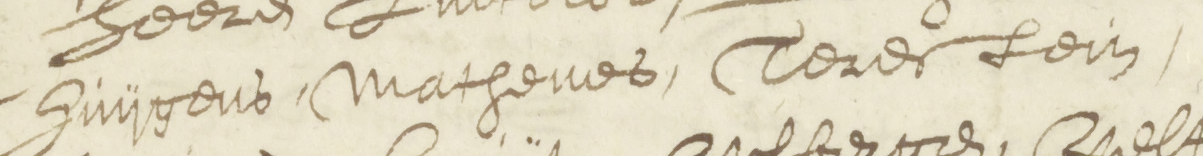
Huijgens, Mathenes, Terestein,
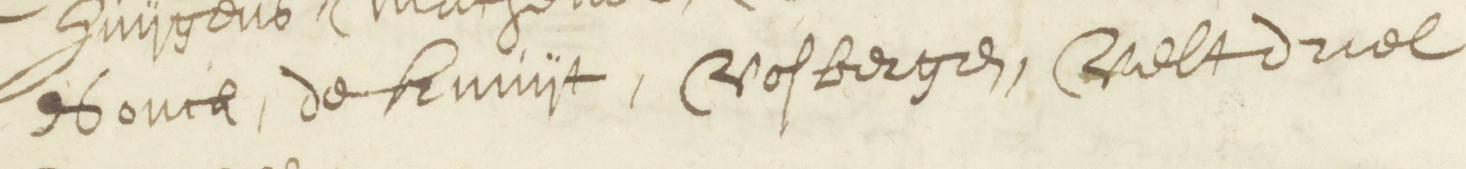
Sonck, deKruijt, Vosbergen, Veltdriel
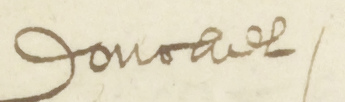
Donckel
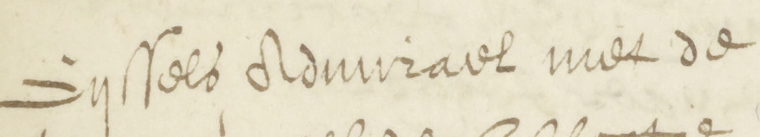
Gijssels Admirael met de
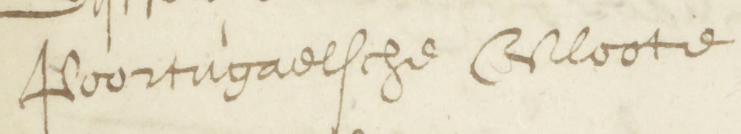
Poortugaelsche Vloote
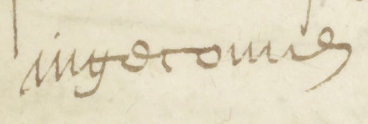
ingecomen
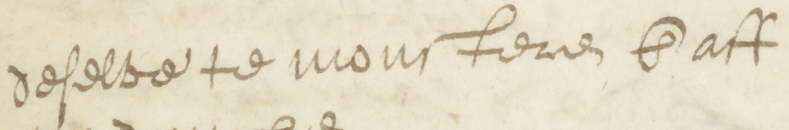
deselve te monsteren & aff
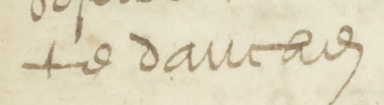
te dancken
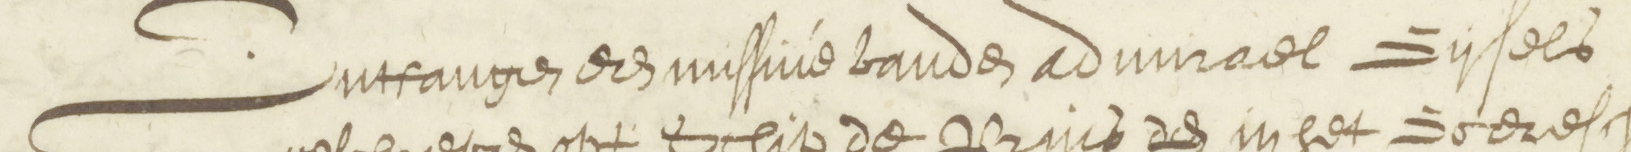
Ontfangen een missiue vanden admirael Gijsels
